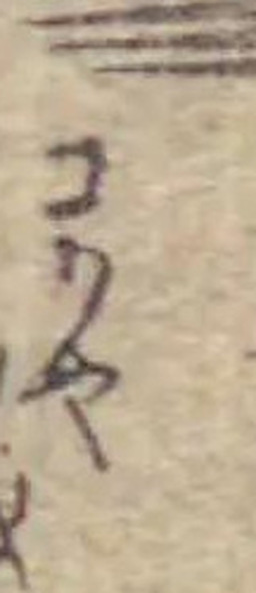そりや
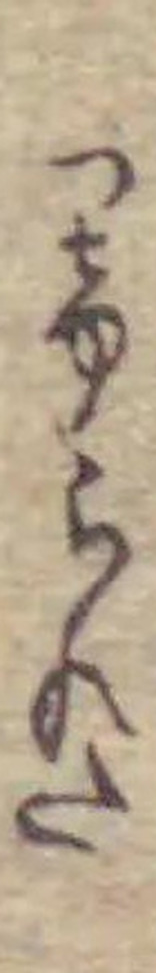つけられた
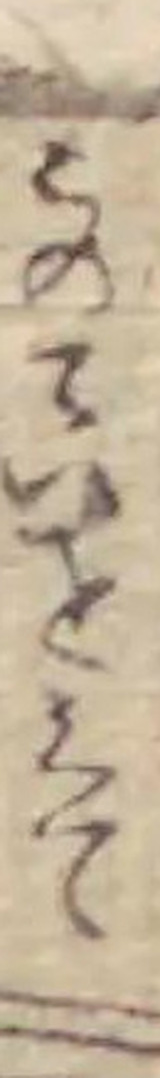このていをみて
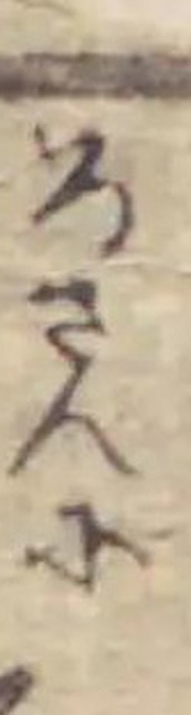いつさんに
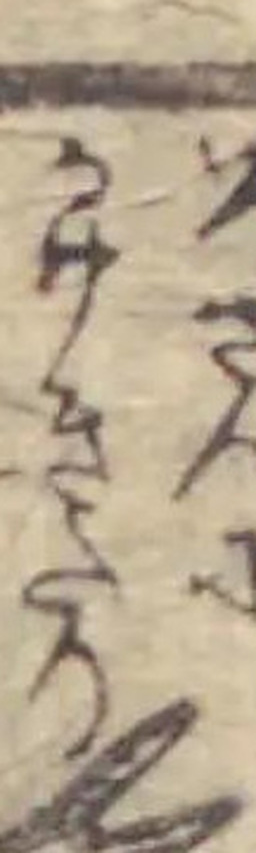かけきたり
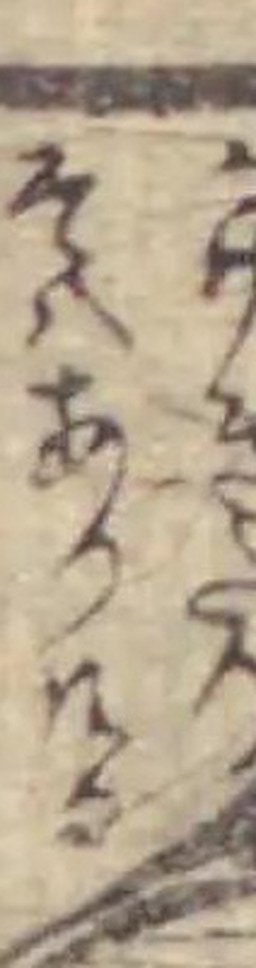そはありける
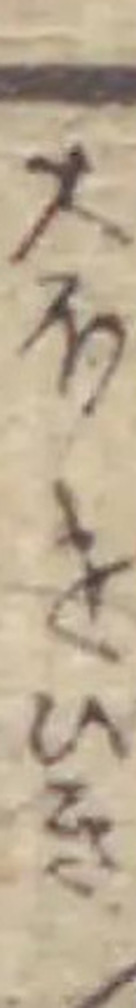大ほくをひき
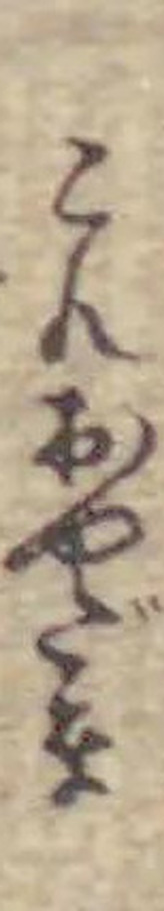これおやだま
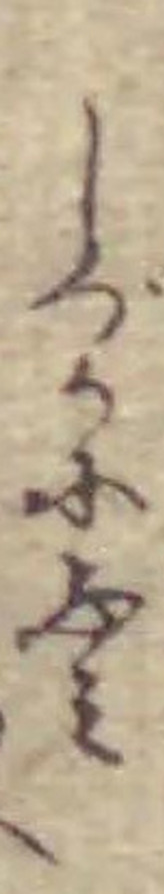しづかにふみ
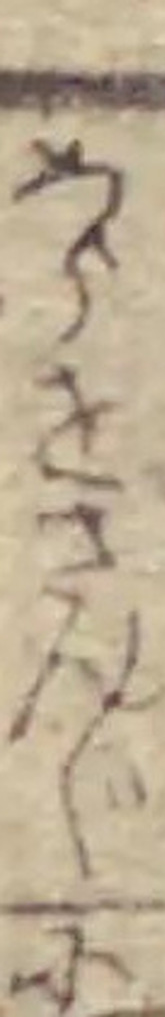めらをさん〴〵に
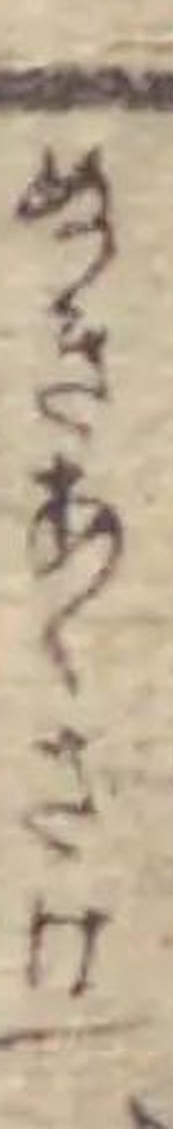ぬきあくさけ
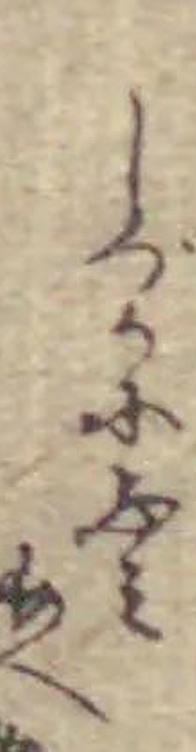しづかにふみ
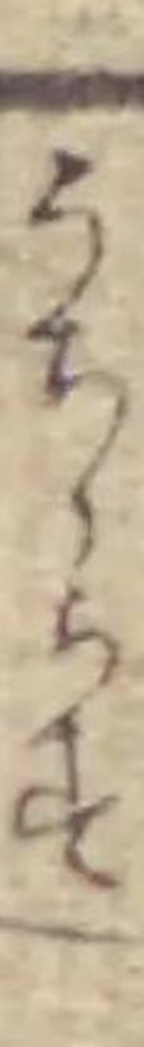うちゝらす
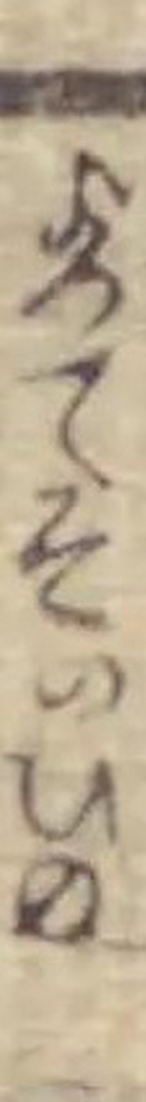よつてそのひの
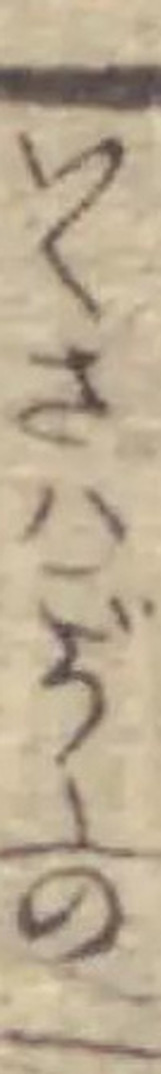いくさはごかくの
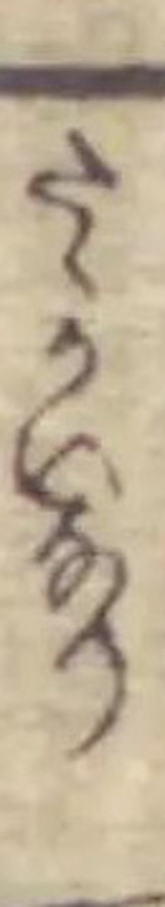たゝかいなり
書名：餅酒腹中能同志 2巻
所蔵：国立国会図書館 National Diet Library, JAPAN
